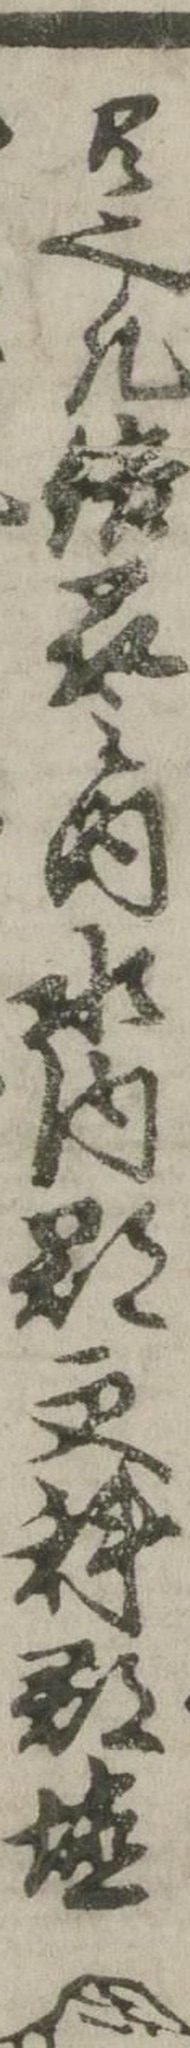共也凡信州之内水内郡更科郡埴
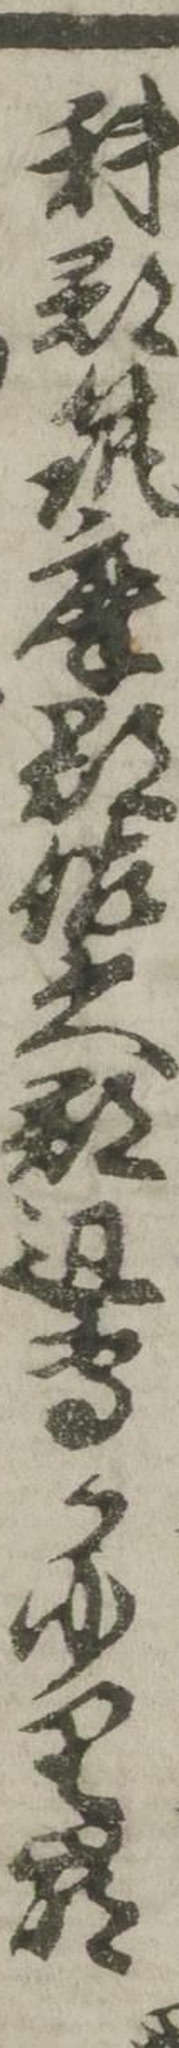科郡筑摩郡佐久郡辺専クゆり崩
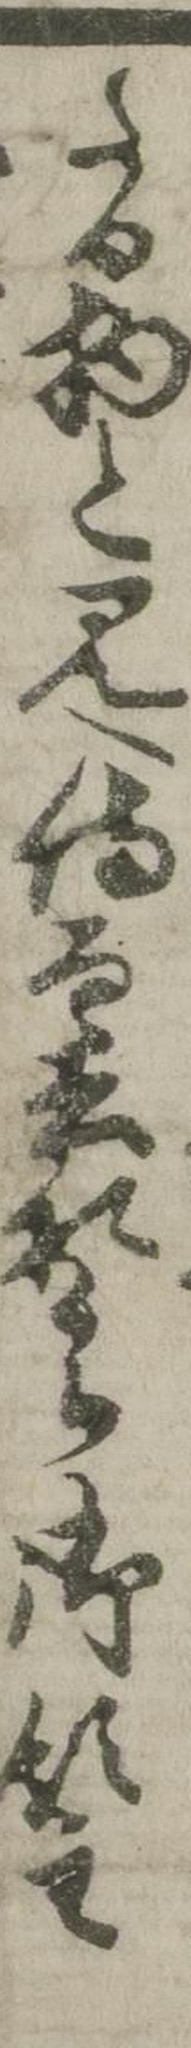たる物と見へ侍る去れとも御領主
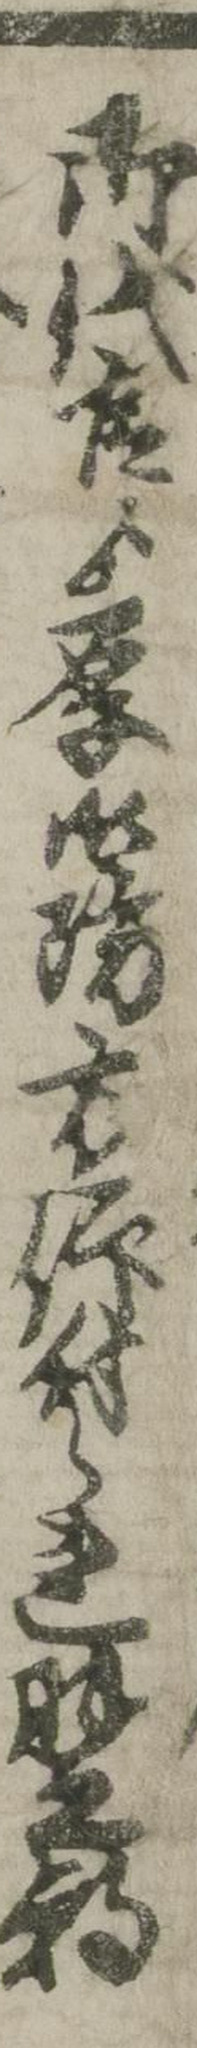御代官ゟ厚御防方被仰付られ翌朝
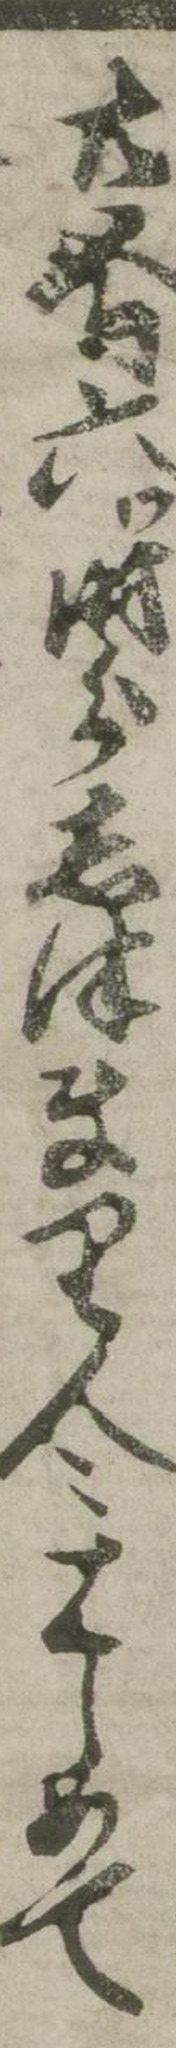廿五日六ッ時分しつまり人々はしめて
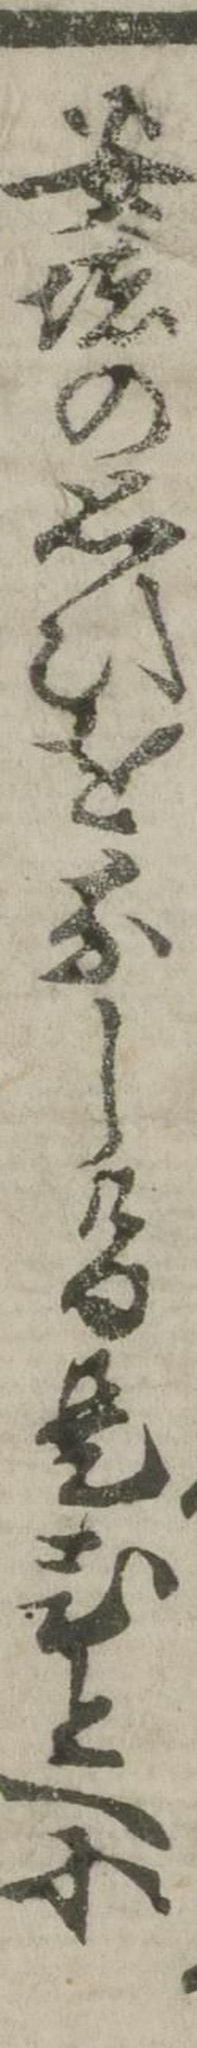安堵の思ひをなしける是ひとへに
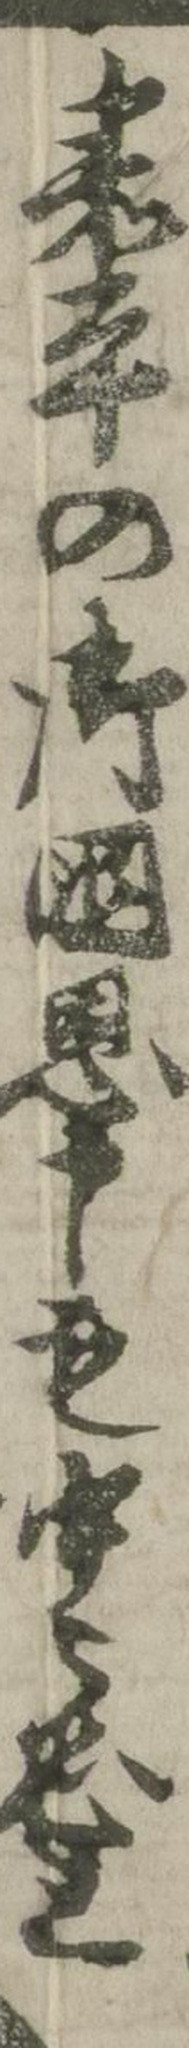泰平の御国恩とも申被恐れ
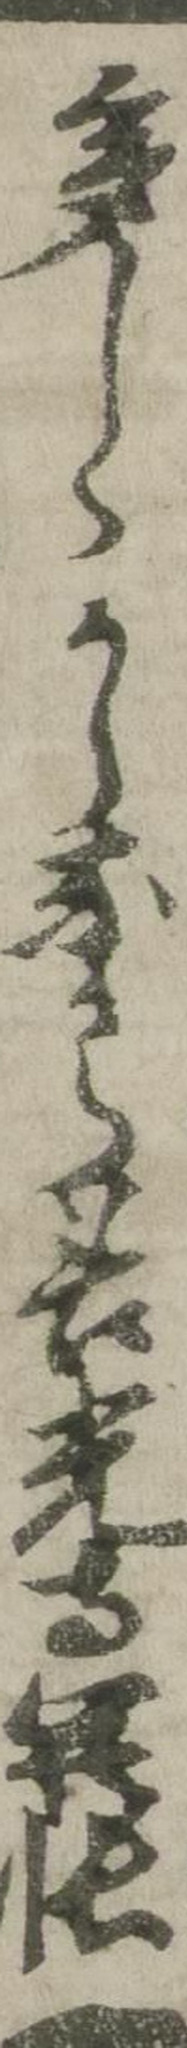多しゝかしな善光寺開帳
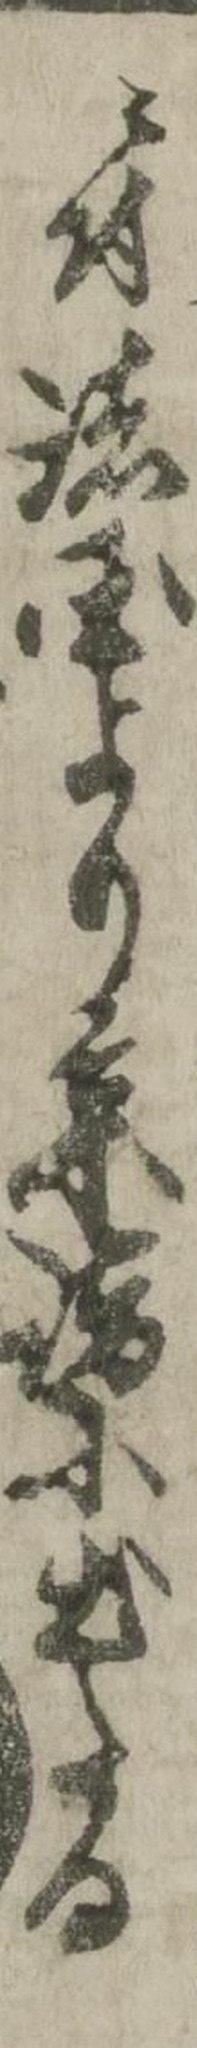二付諸国より参詣に出たる
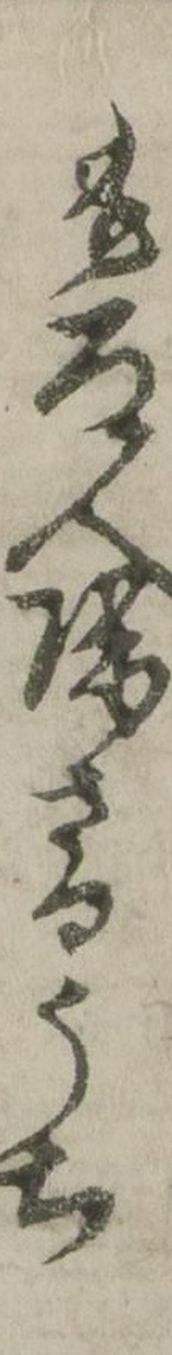もろ人さるうち
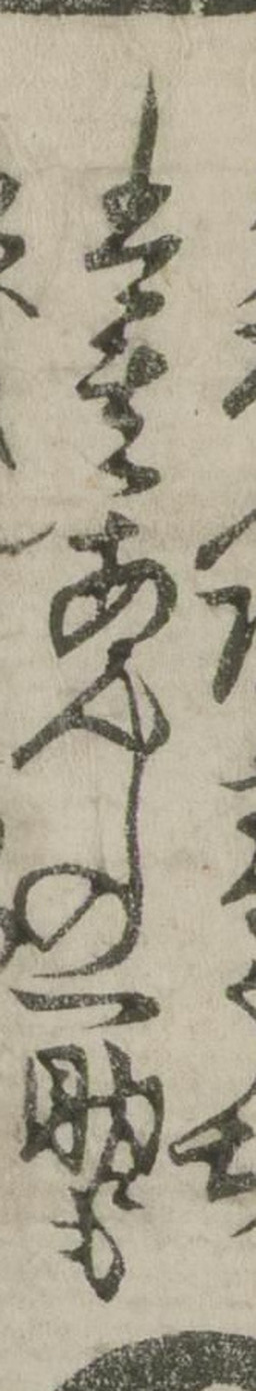は其あんしの一助二も
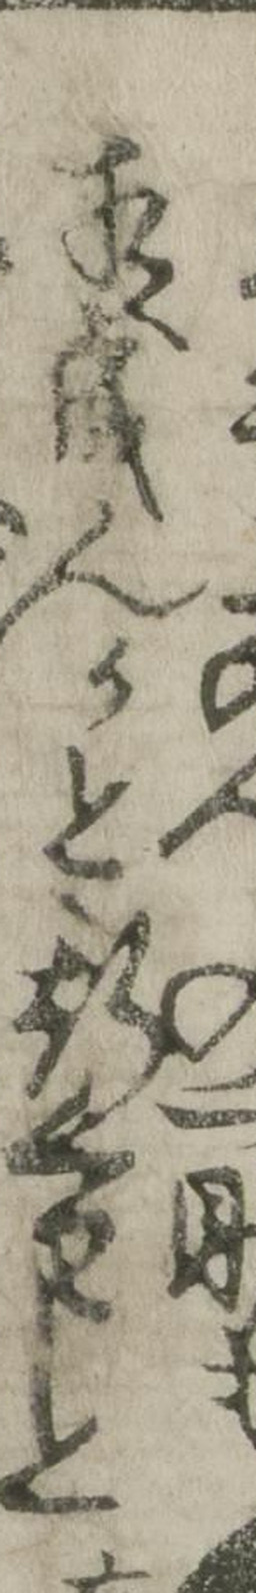相成んかと斯く申上
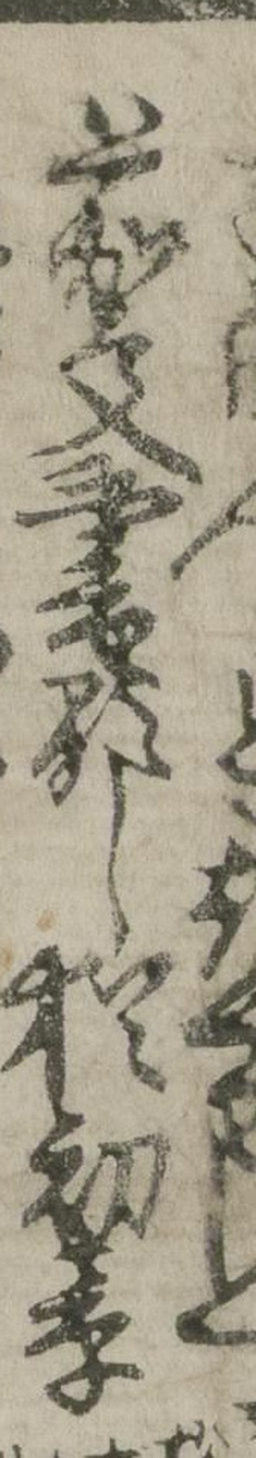前文書筆顕し猶初筆
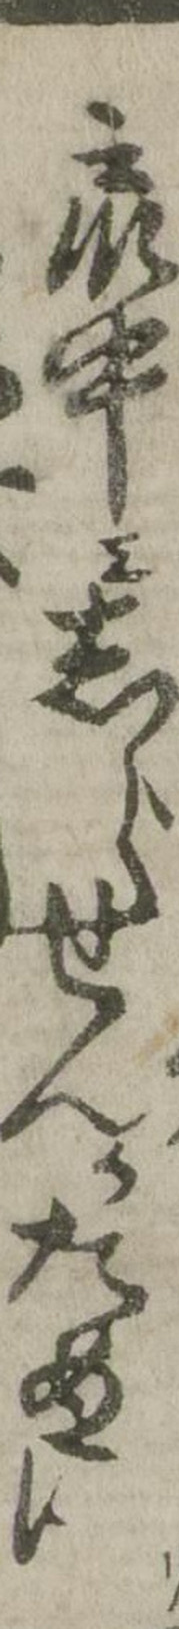衆中二しらせんかために
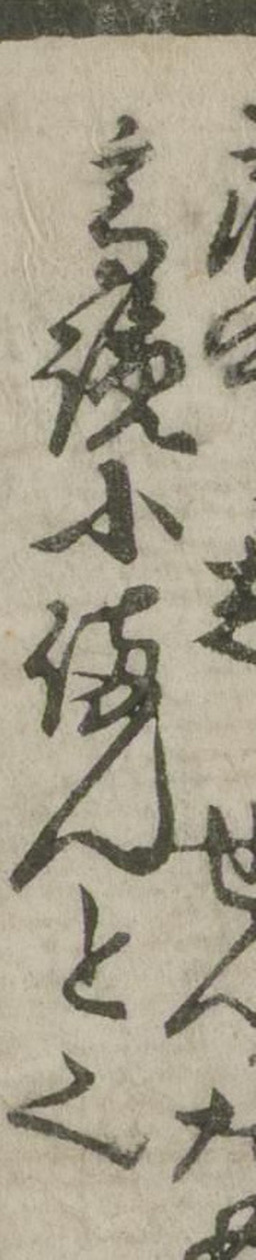高覧に備んと也
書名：[善光寺地震に関する瓦版]
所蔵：東京大学地震研究所図書室 Earthquake Research Institute Library, The University of Tokyo, JAPAN
